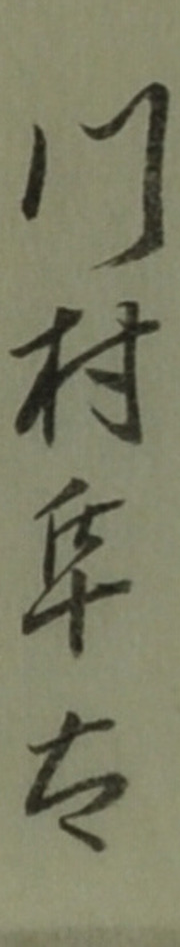川村隼太
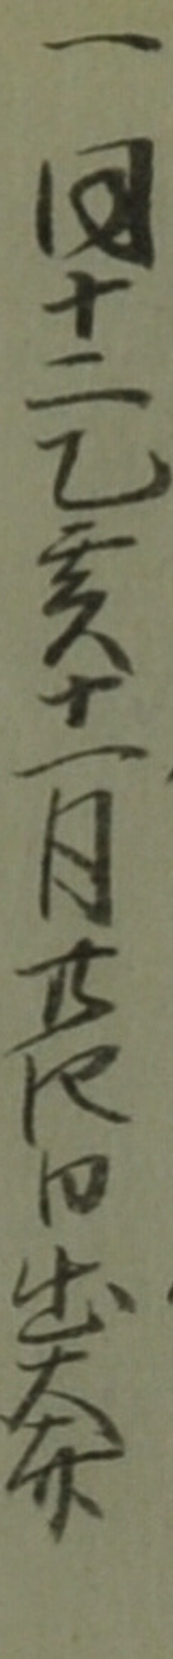一同十二乙亥十一月廿四日出奔
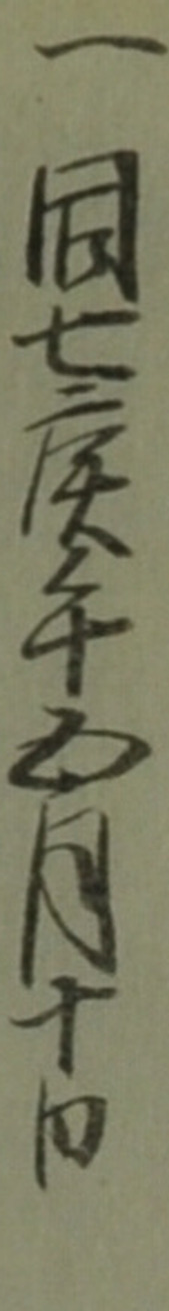一同七庚午五月十日
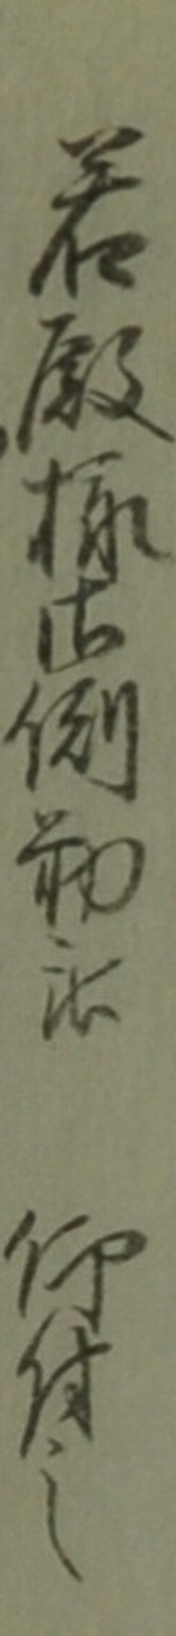若殿様御側勤被仰付之
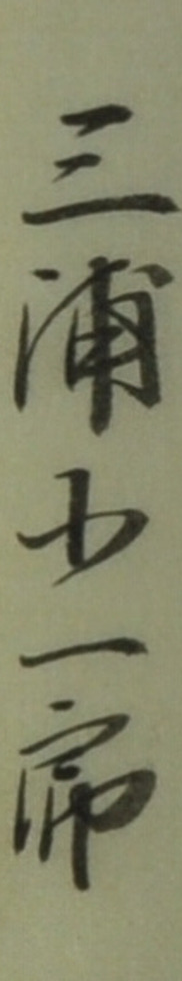三浦小一郎

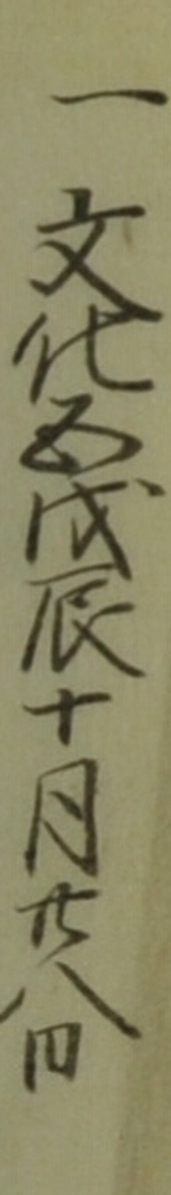一文化五戊辰十月廿八日
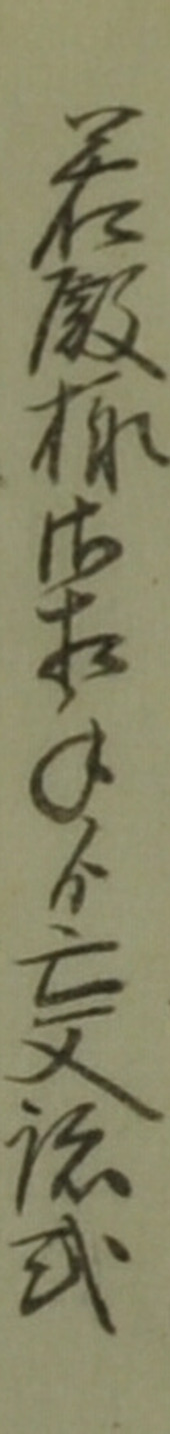若殿様御相手ゟ亡父跡式
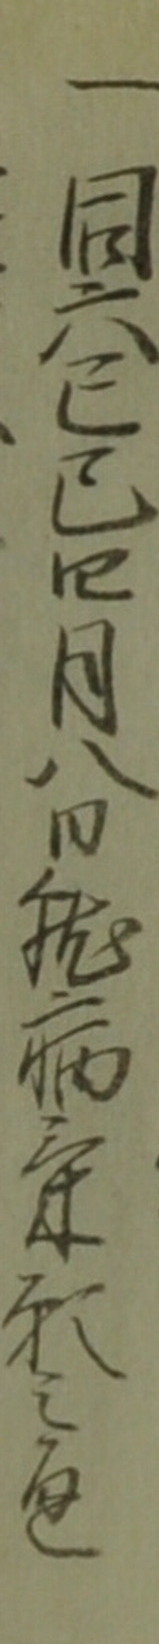一同六己巳四月八日就病気願之通
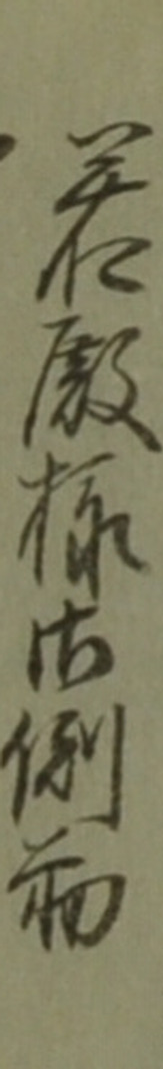若殿様御側勤
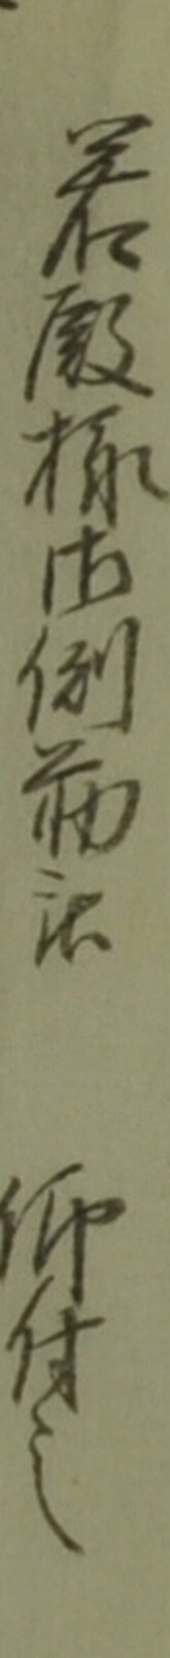若殿様御側勤被仰付之
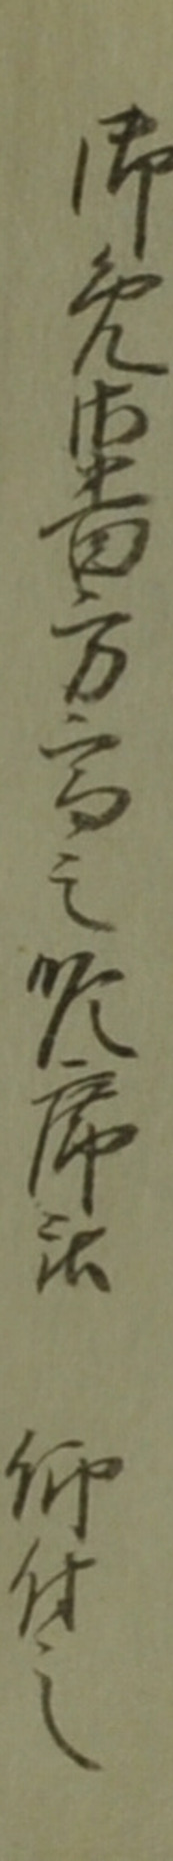御免御番方高之順席仰付之
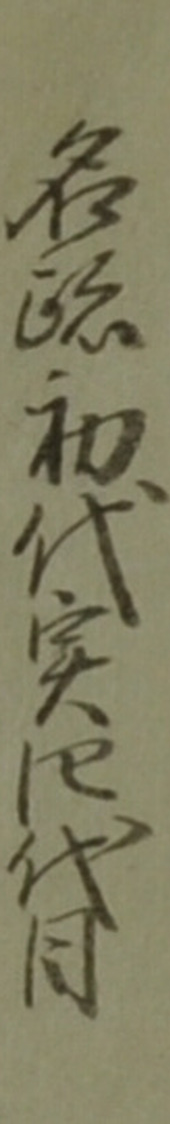名跡初代実四代目
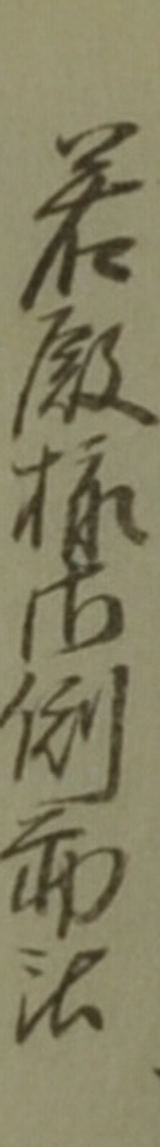若殿様御側勤
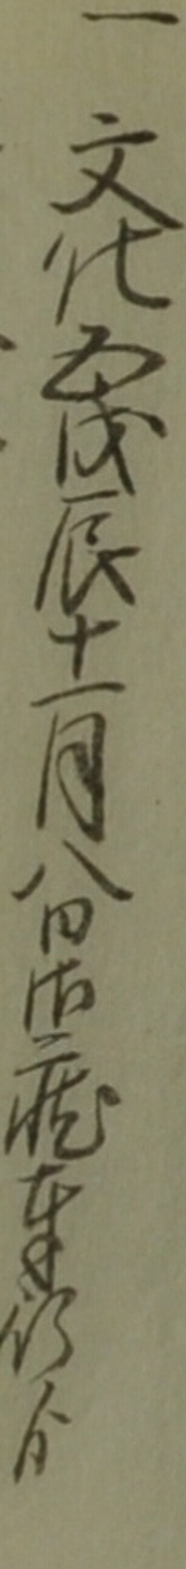一文化五戊辰十一月八日御蔵奉行ゟ
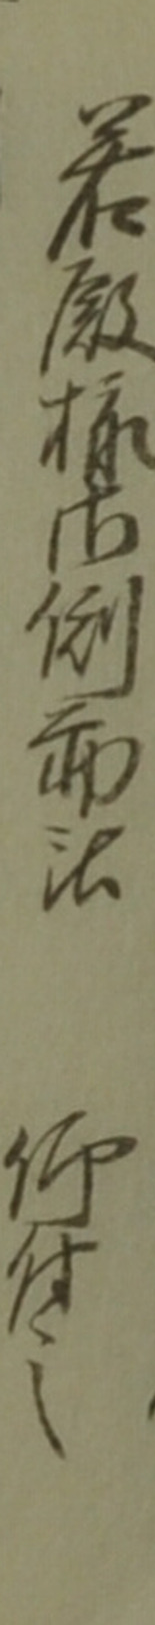若殿様御側勤被仰付之
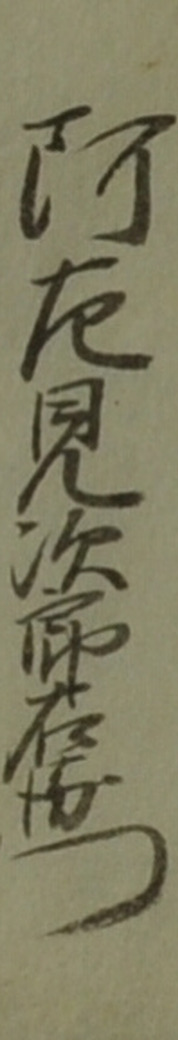阿左見次郎右衛門
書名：諸御役代々録（五）
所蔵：伊那市立高遠町図書館・合同会社AMANE
